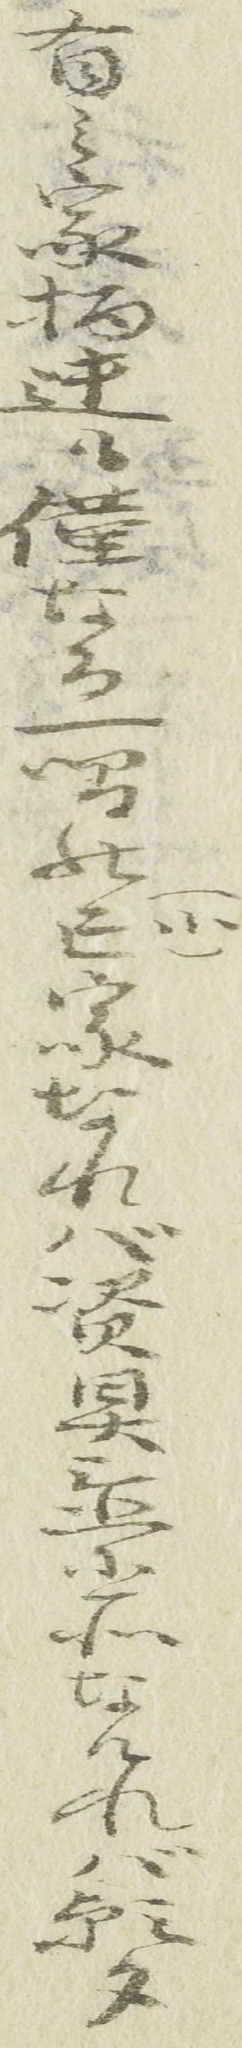有之家柄迚も僅なる一間の己家なれば資具置に所なければ朝夕
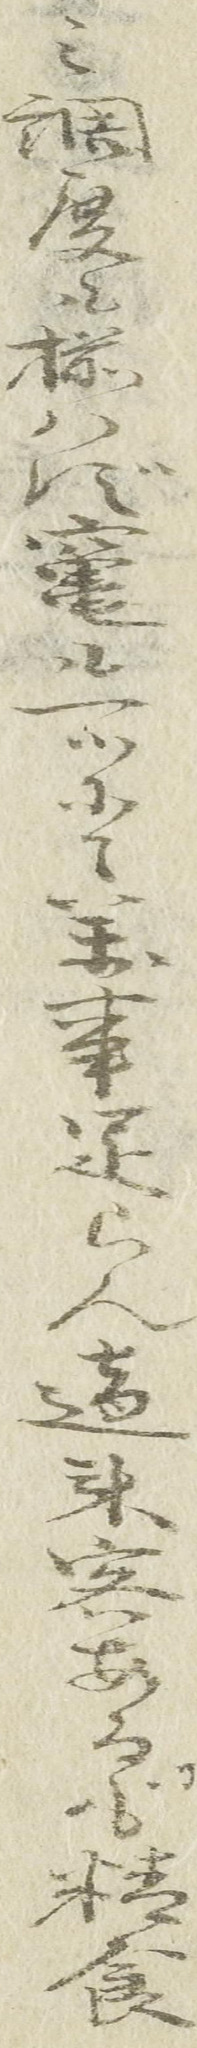之調度も揃はず竈も一ツにて万事足らん適来客あるにも精食
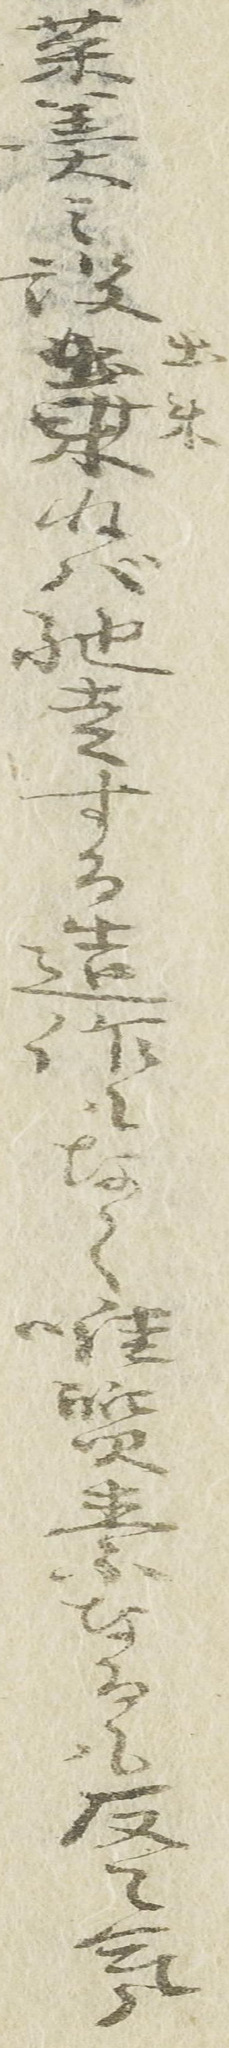菜美之設出来ねば馳走する造作もなく唯質素になるも反て気
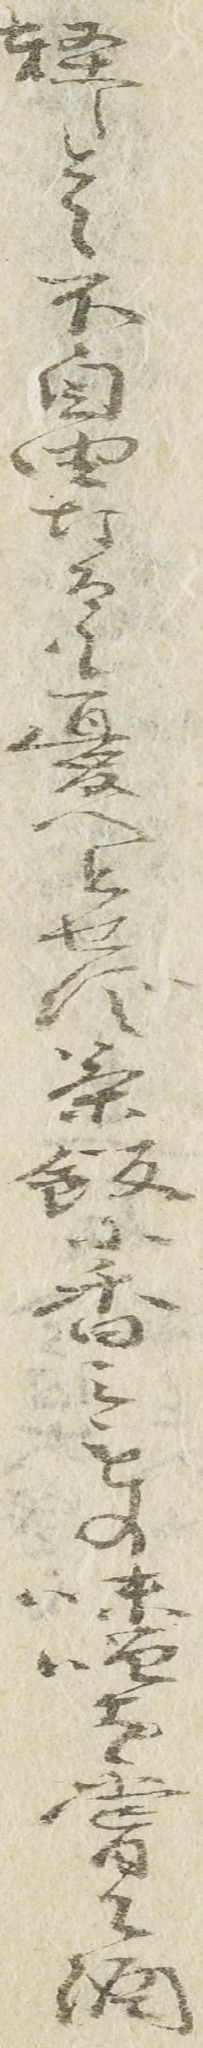軽しとて不自由なるも憂へとせず茶飯に香之もの味噌を嘗て酒
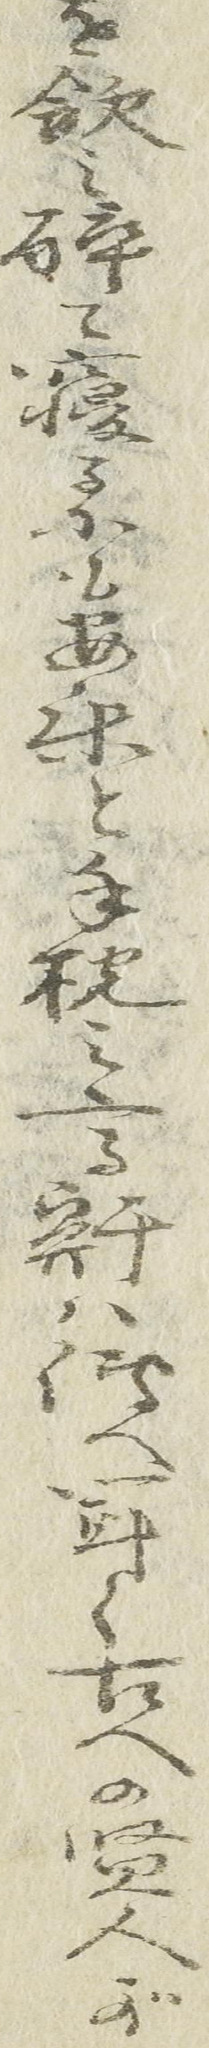を飲み酔て寝るにも安楽と手枕之高鼾は伝へ聞く古への賢人が
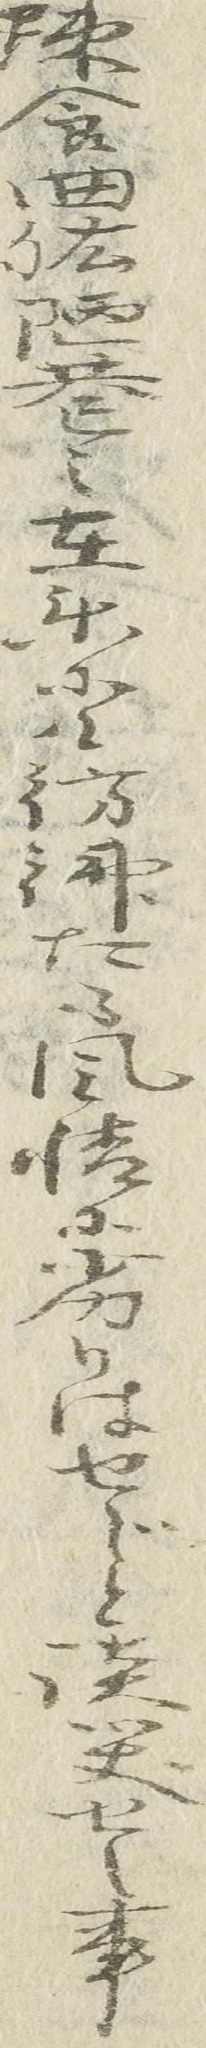疎食曲肱陋巷之在楽にも彷彿たる風情に劣りはせじと談笑せし事
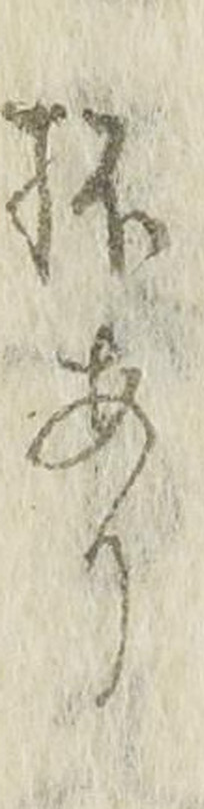抔あり
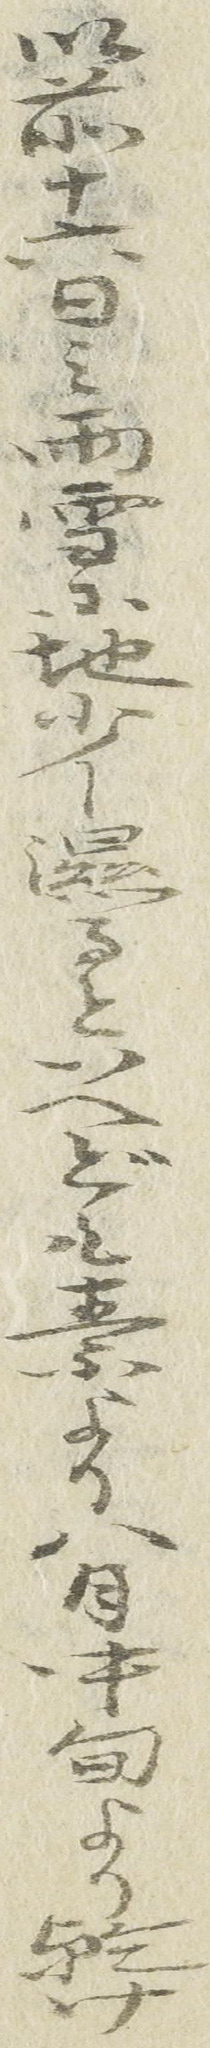以前十六日之雨雪に地少し湿るといへども素より八月中旬より乾け
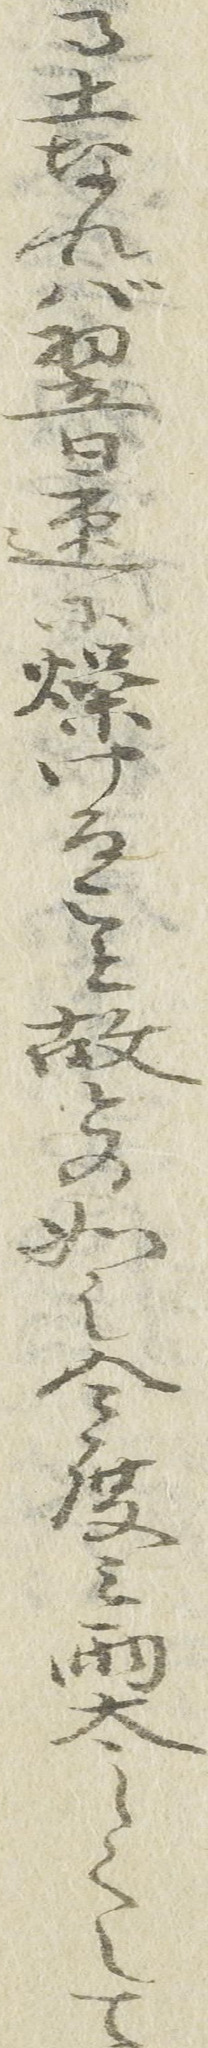る土なれば翌日速に燥けること故との如し今度之雨太しくして
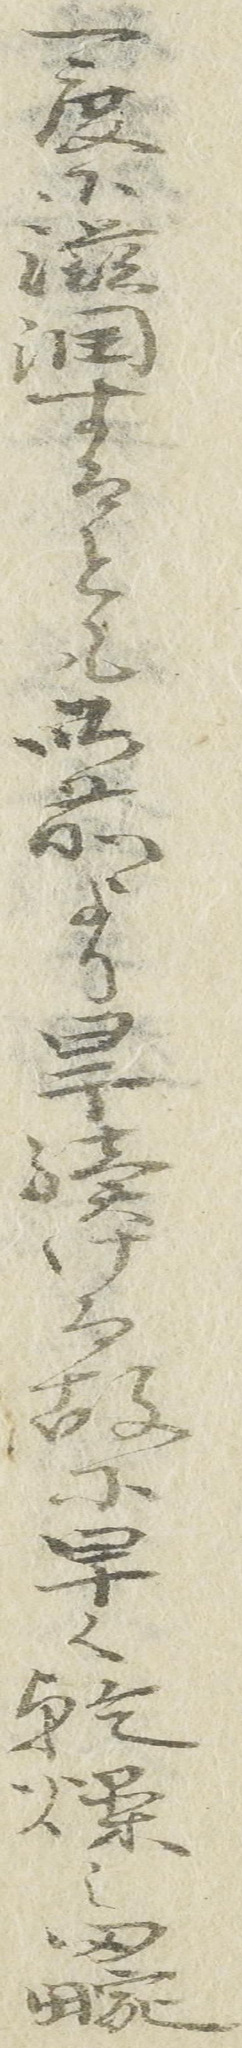一度に滋潤するとも以前より旱続ける故に早く乾燥之田畹

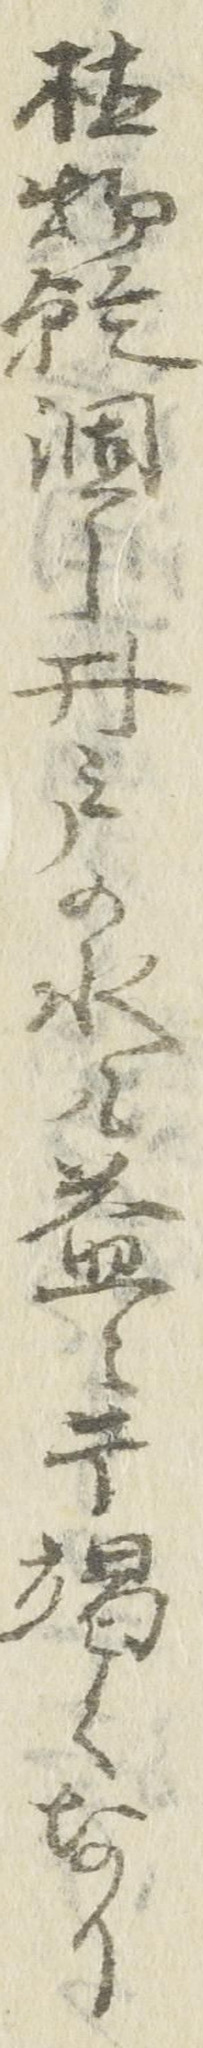植物乾涸し井戸の水も益〻干竭くなり
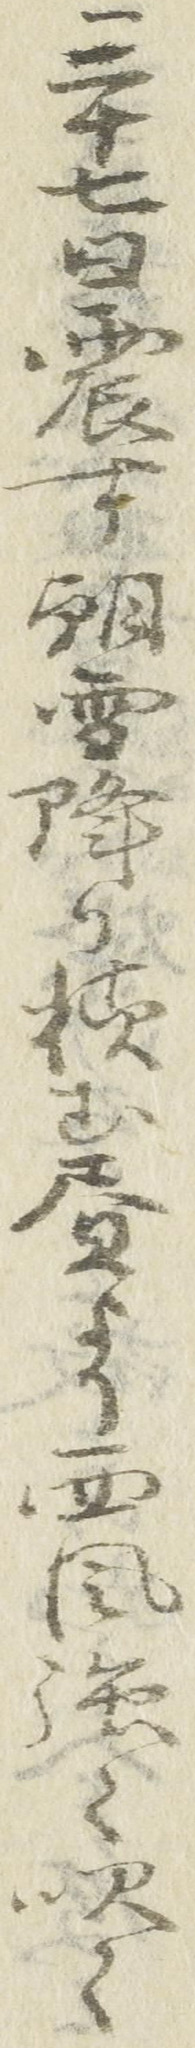、二十七日震す朝雪降り積む昼より西風強く吹く
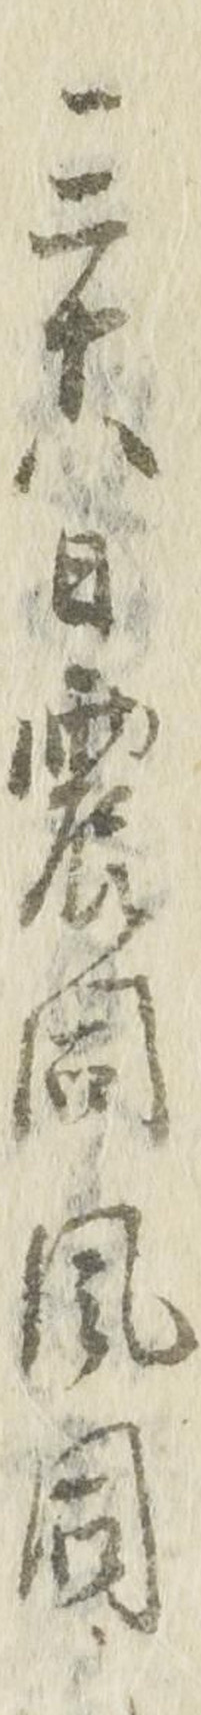、二十八日震同風同
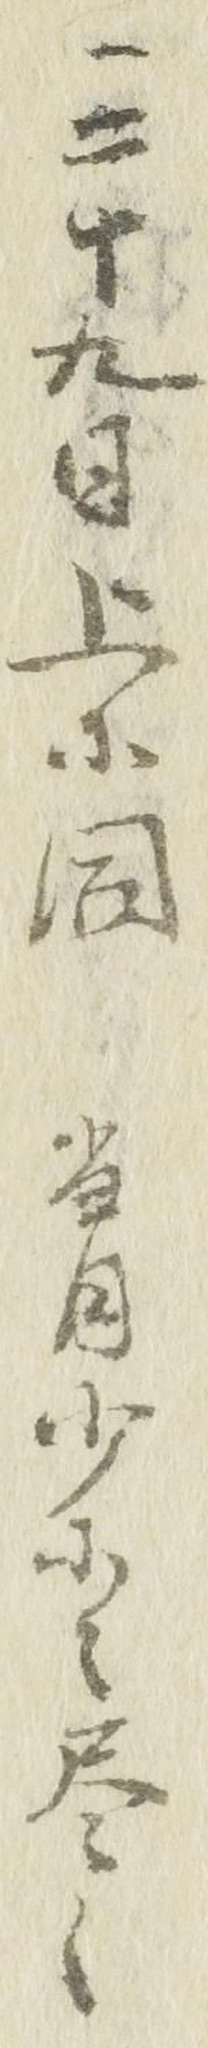、二十九日上に同当月少にて尽く
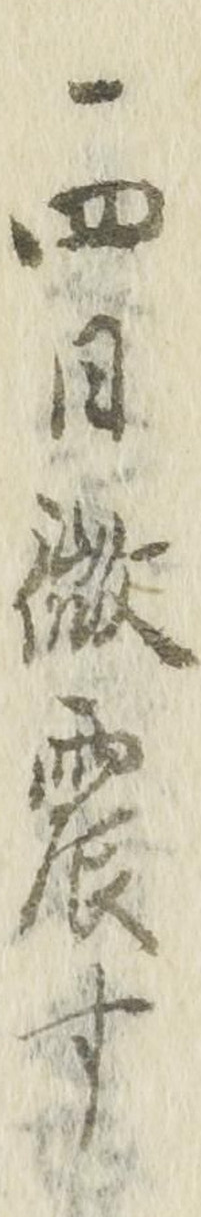、四日微震す
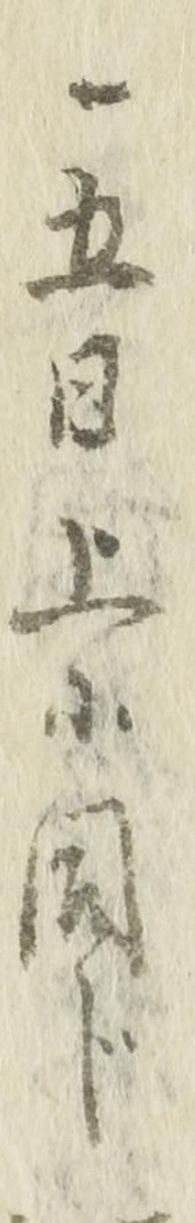、七日上に同じ
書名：地震前兆集　全
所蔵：東京大学地震研究所図書室 Earthquake Research Institute Library, The University of Tokyo, JAPAN
